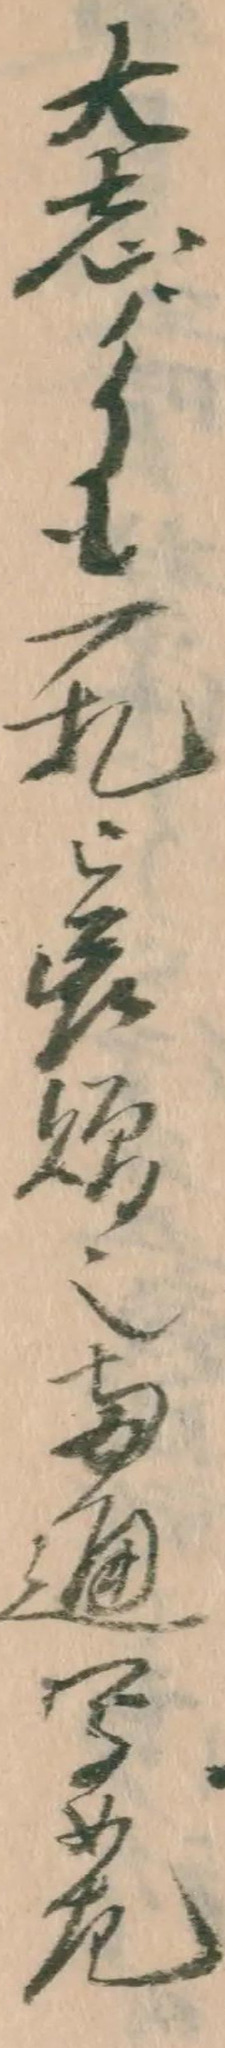大志ゟも一札被差贈也両通写如左
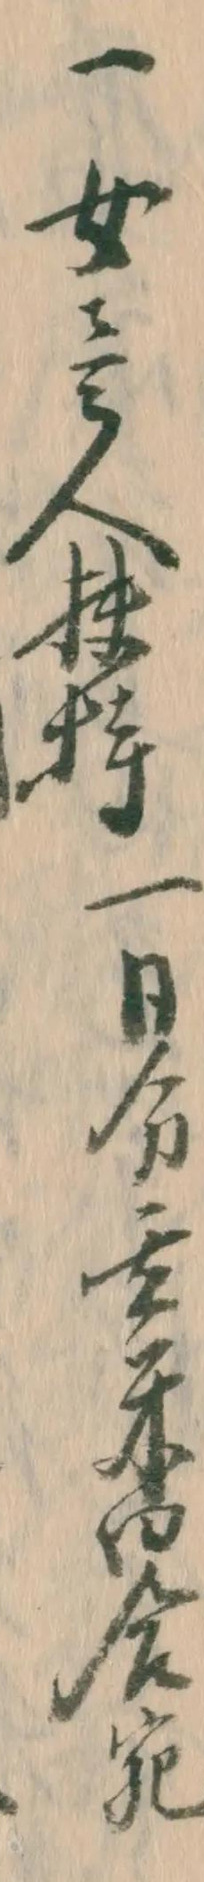一女壱人扶持一日分玄米四合宛
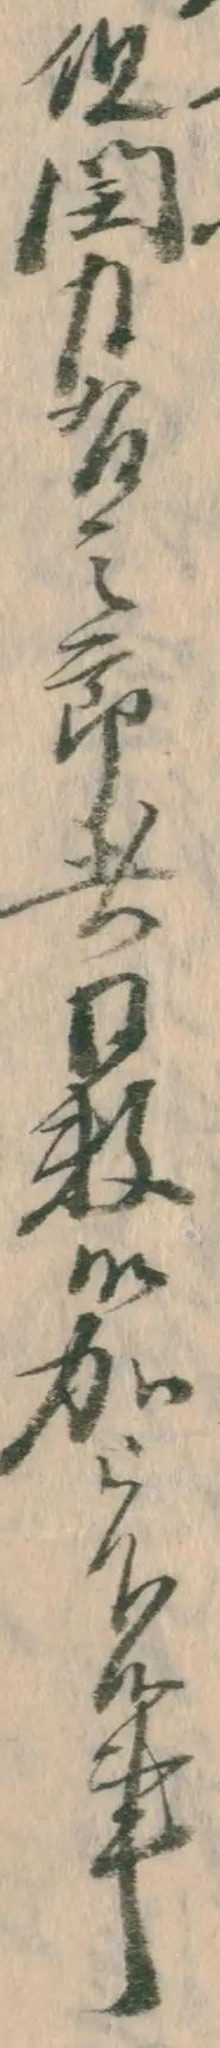但閏月有之節者日数御加被下候事
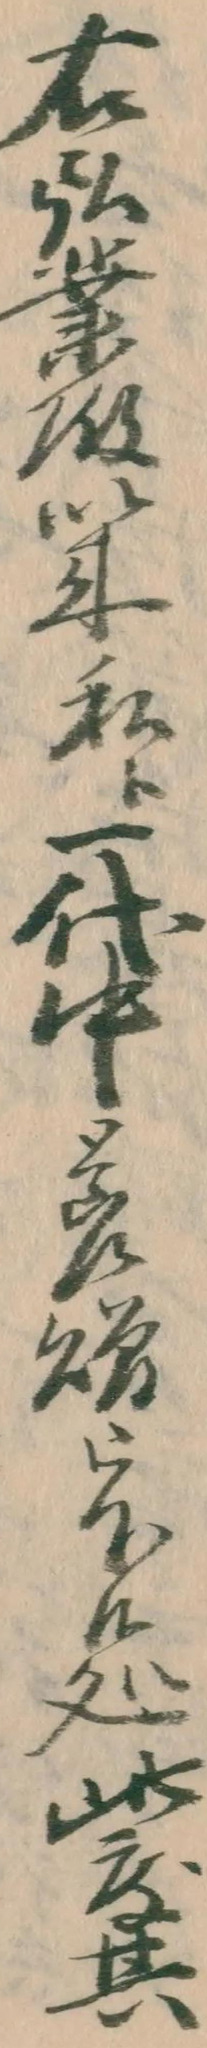右弘業殿以来私ト一代中差贈被下候処此度其
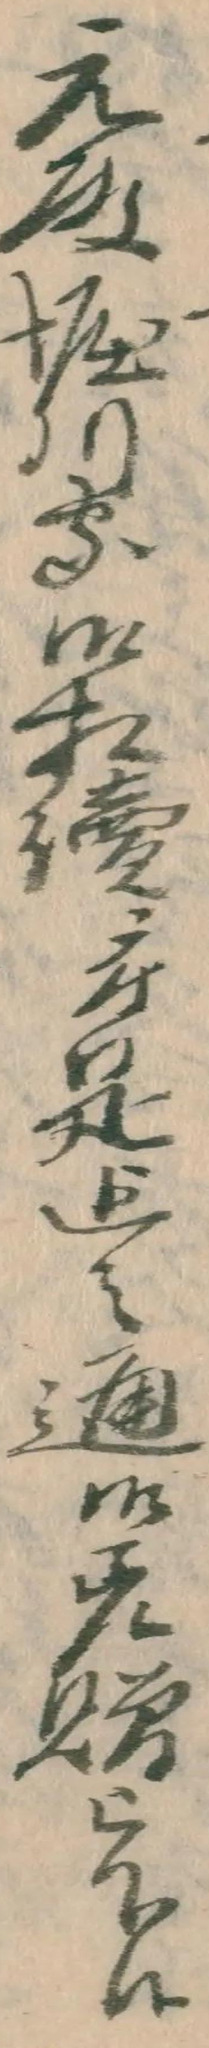元殿堀川家御相續ニ付是迄之通御差贈被下候
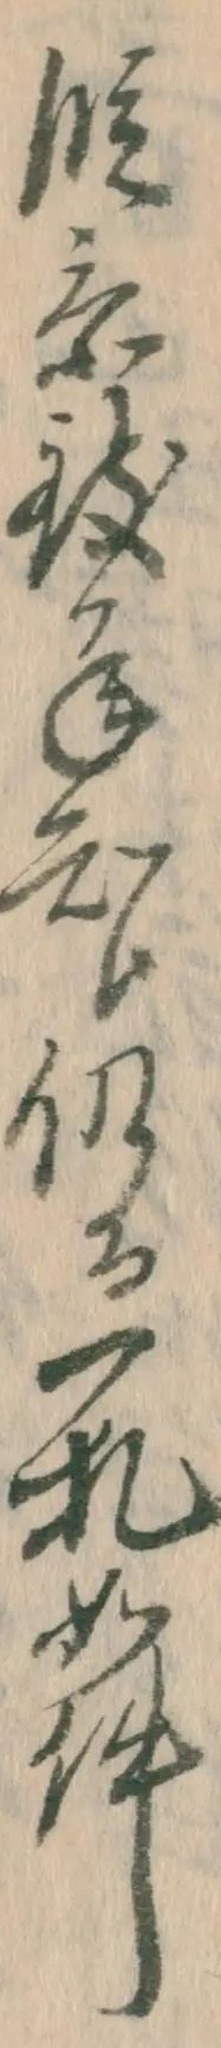段乗致承知候仍而一札如件
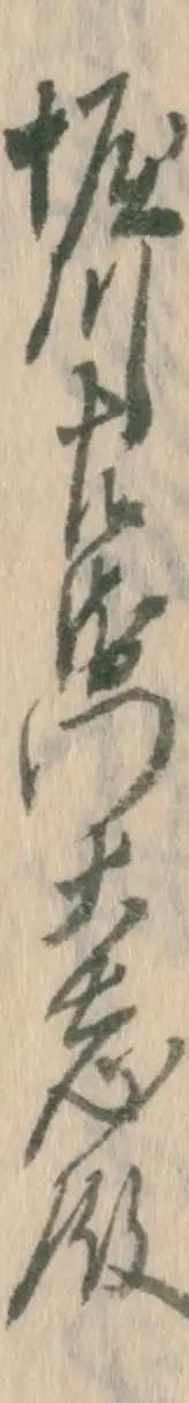堀川左衛門大志殿
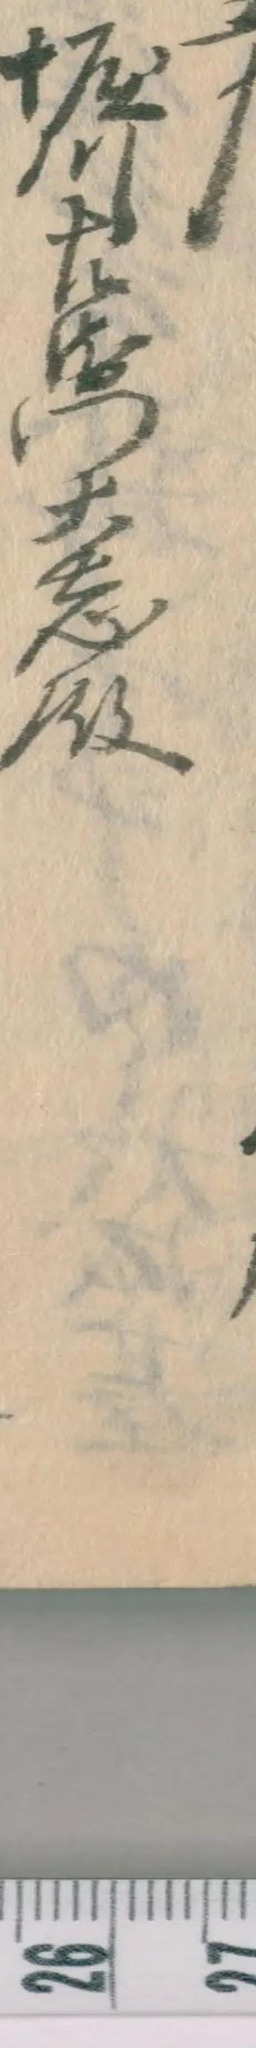堀川左衛門大志殿
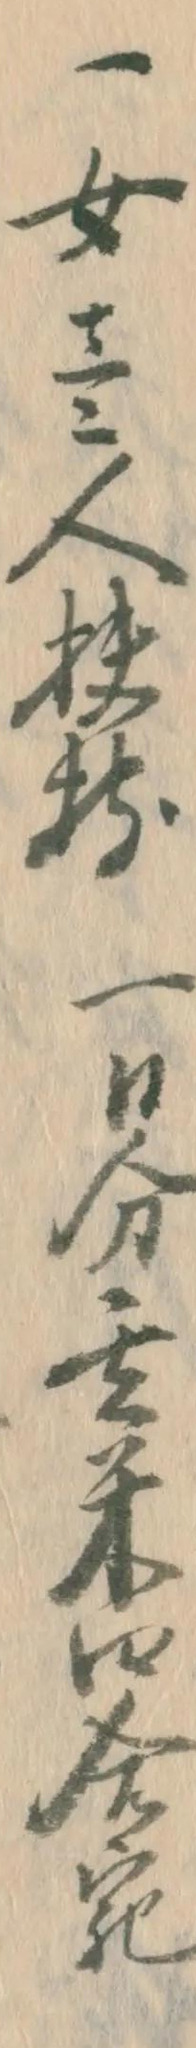一女壱人扶持一日分玄米四合宛
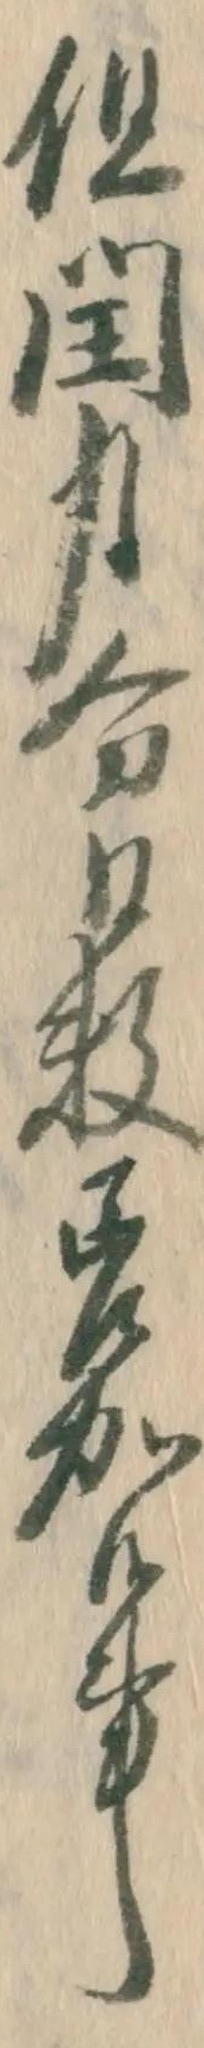但閏月分日数差加候事
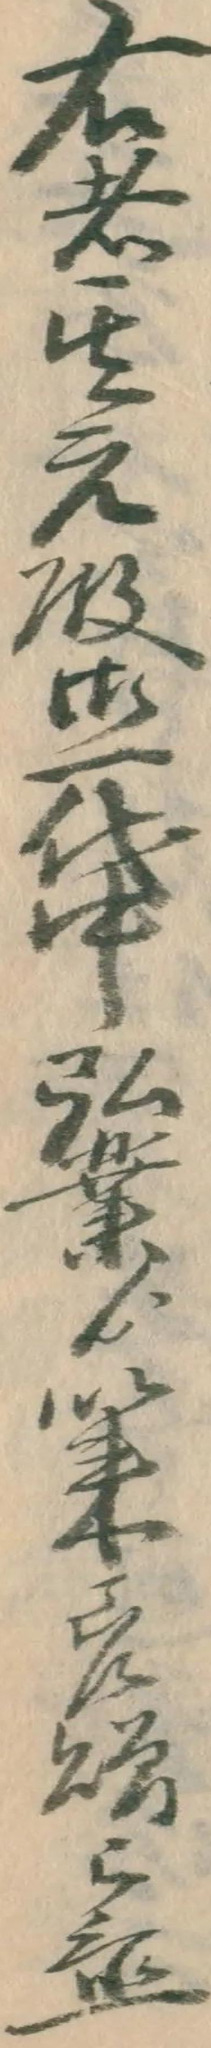右は其元殿御一代中弘業ゟ以来差贈被置

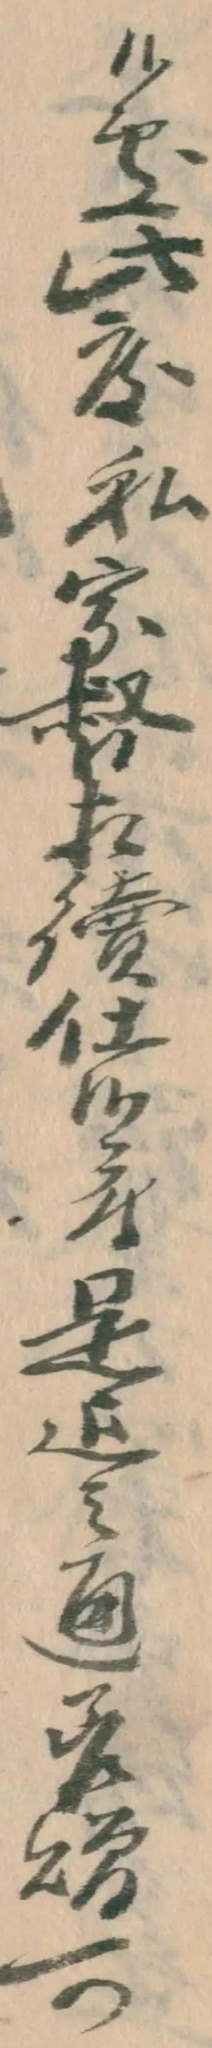候處此度私家督相続仕候に付是迄之通差贈可
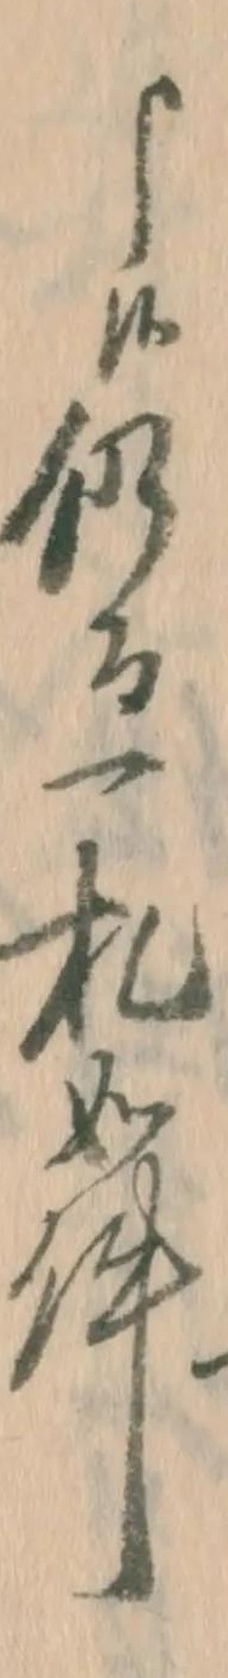申候仍而一札如件
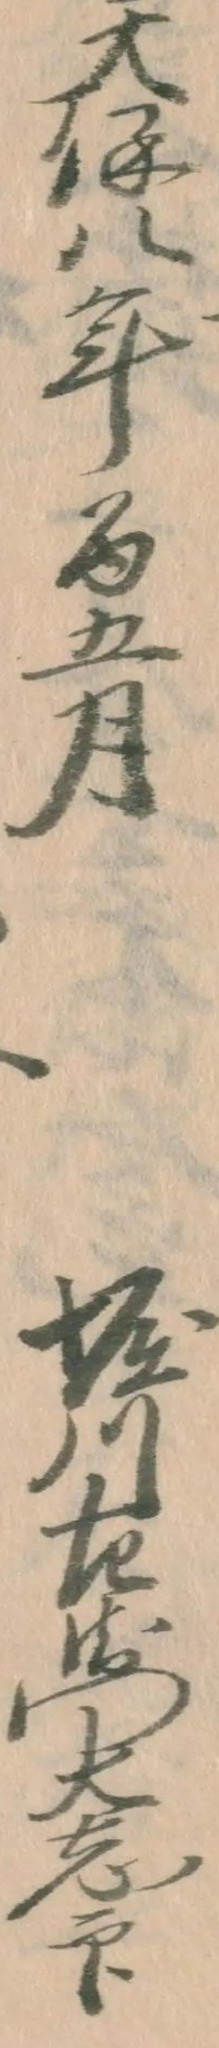天保八年酉五月堀川左衛門大志印
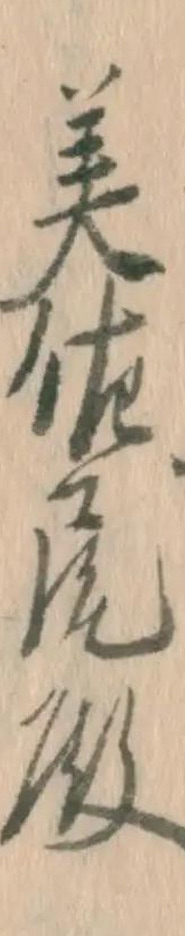美佐尾殿
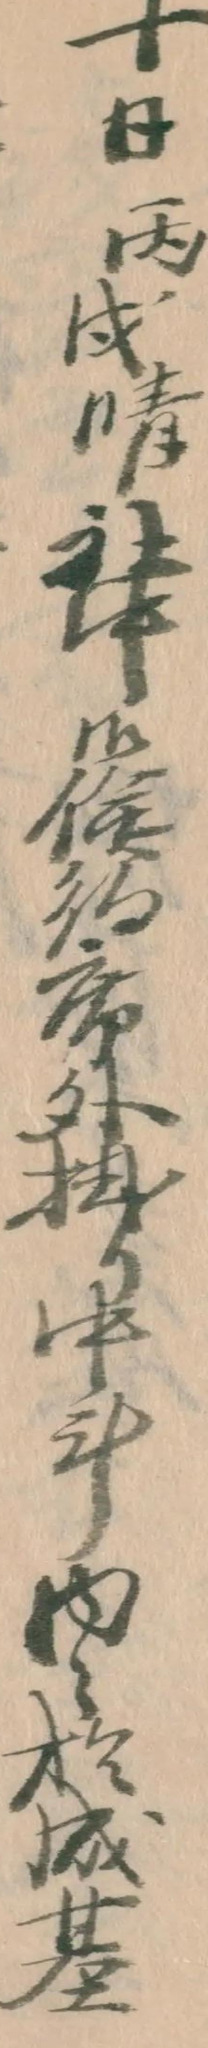十日丙戌晴社中御倹約席外掛り中斗内々於成基
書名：賀茂社記録. 第67冊
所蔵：国立国会図書館 National Diet Library, JAPAN
